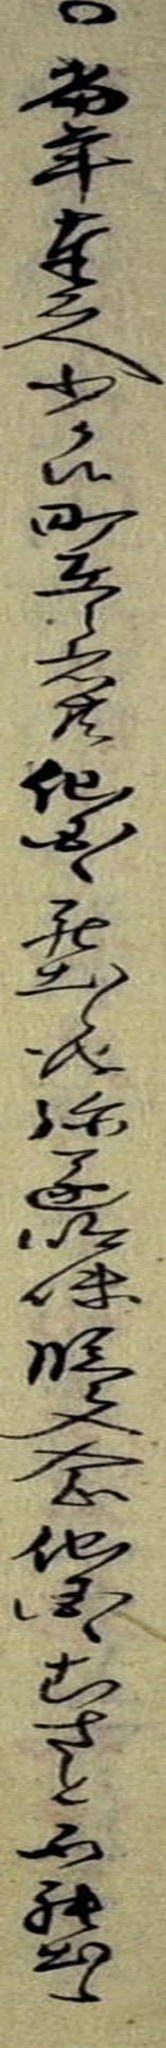〇当年奉公人少ク候町在之者共他国へ罷出候儀弥遂吟味段々入念他国へむさと不罷出候
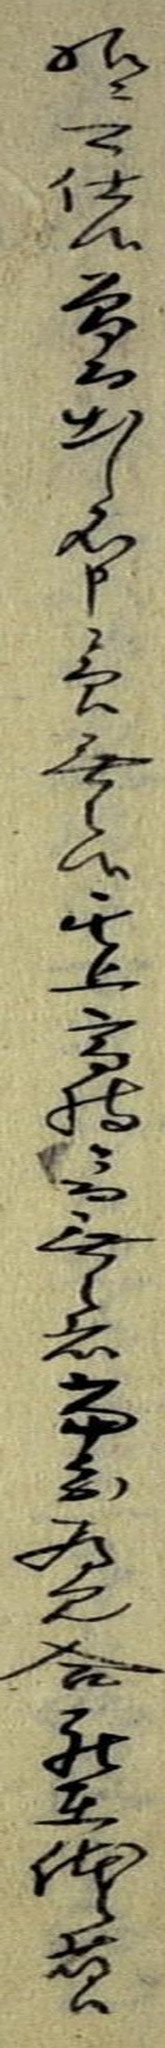様ニ仕候曽而出し不申ニ而ハ無之候其上高持ニ而無之者当分為見合罷在体之者ハ
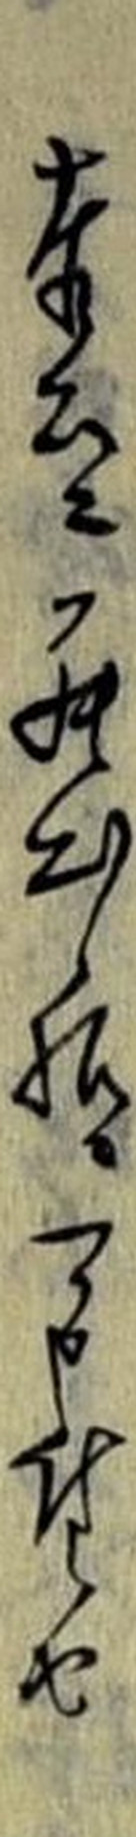奉公ニ罷出候様ニ可申付候由
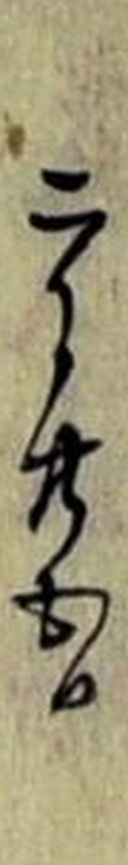二月廿五日
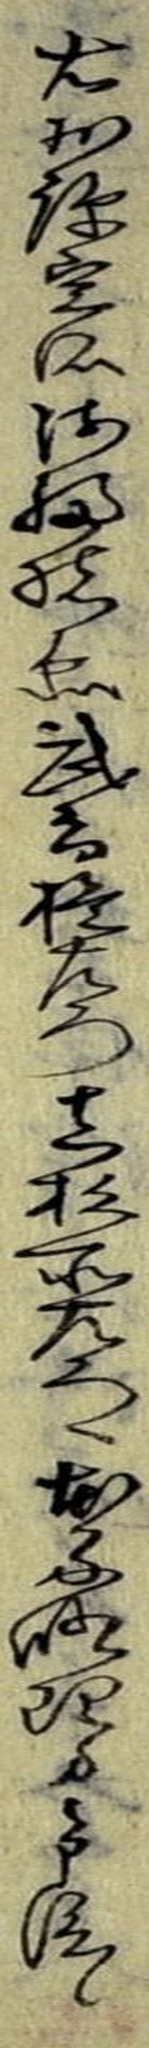右於評定所海福猪兵衛武曽権左衛門真杉所左衛門へ本多修理方被申渡候
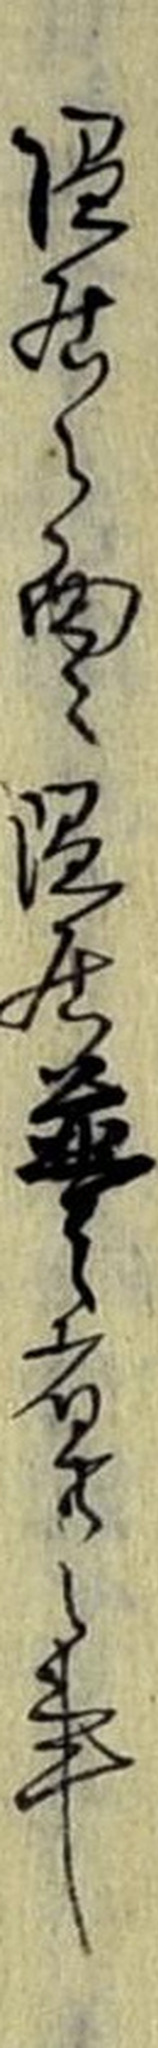隠居之面々隠居並之者共之事
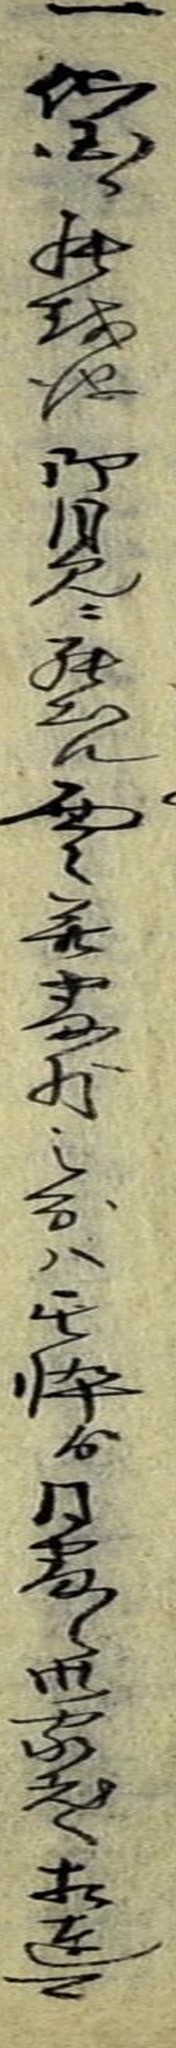一御国へ罷越儀御目見ニ罷出ル面々并番外之分ハ其忰ゟ月番之御家老へ相達可
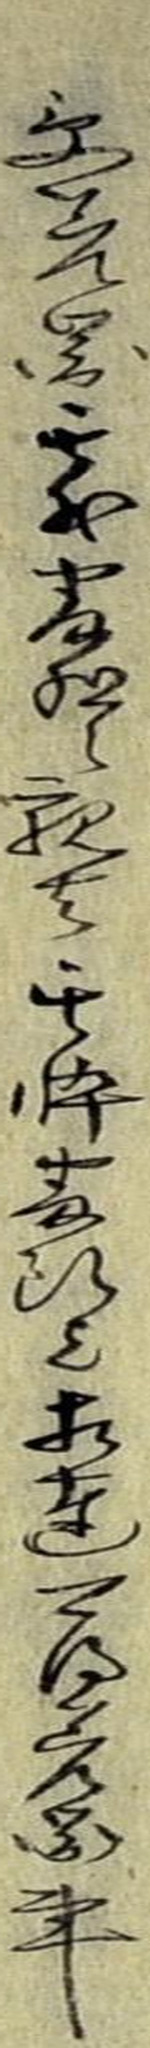受差図其外番組之親者其忰番頭迄相達可得差図事
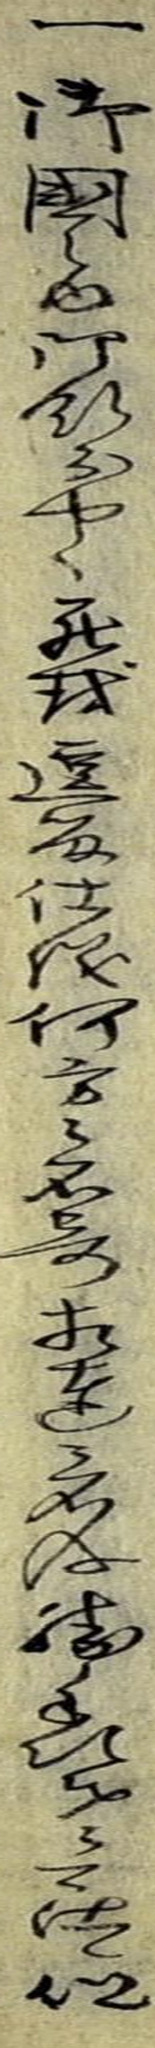一御国之内御領分中へ罷越逗留仕儀何方ニ不寄相達ニ不及勝手次第ニて可仕候但
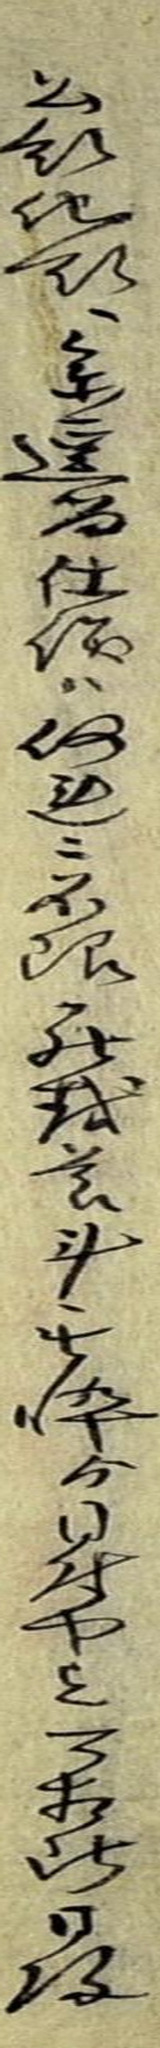公領他領へ参逗留仕儀ハ何連ニ不限罷越節斗其忰ゟ目付中迄可相断日帰
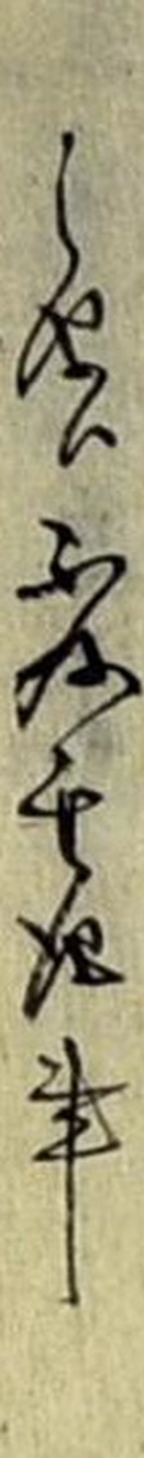之儀ハ不及其儀事
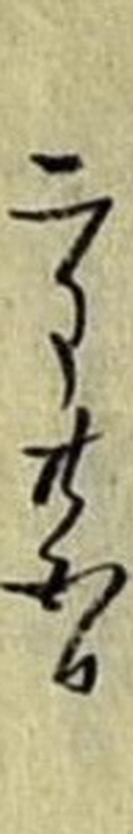二月廿五日
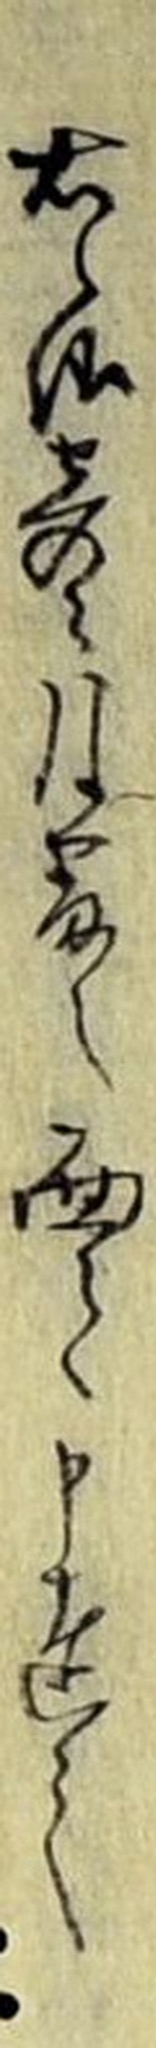右之趣寄々月番之面々へ申達之

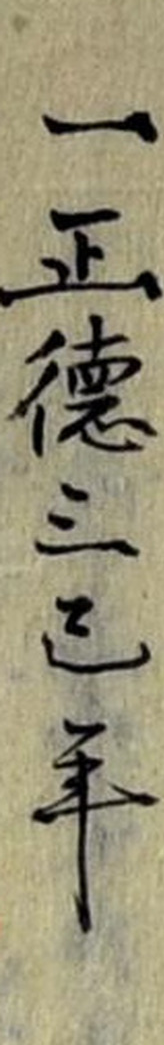一正徳三巳年
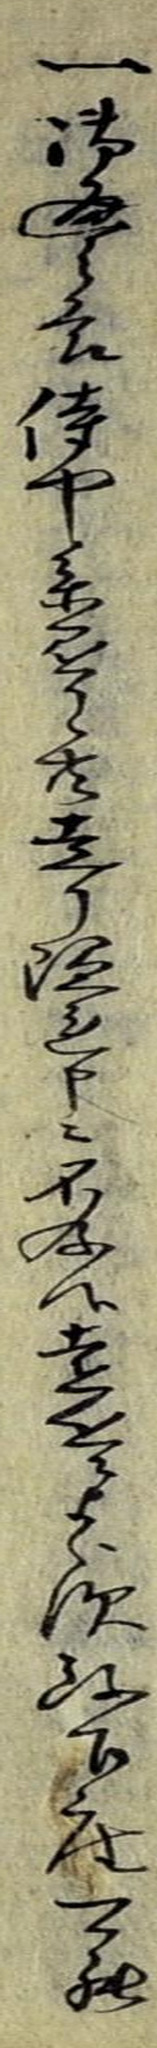一御通之節侍中参懸り候共走り隠れ申ニ不及候遠近ニよらす致下座可罷
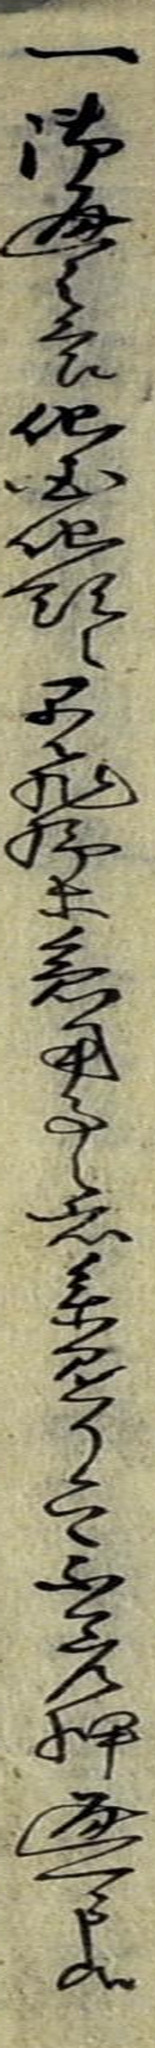一御通之節他国他領へ早飛脚等急用事之者参懸り候ハヽ不差押通可申候
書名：命令之部 一
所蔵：福井県文書館 Fukui Prefectural Archives
